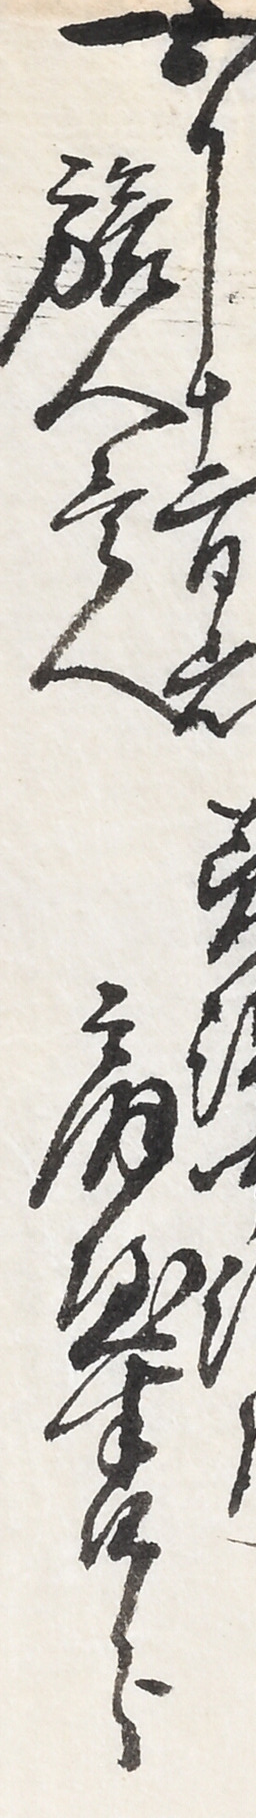一旅人壱人扇屋半四郎
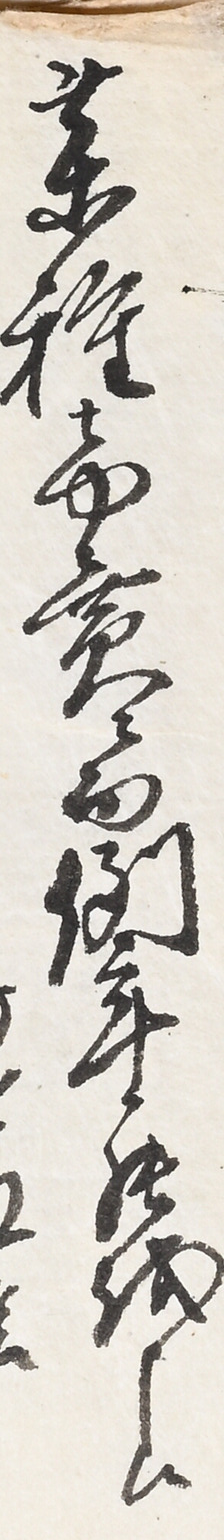薬種商売ニ而例年罷越申候
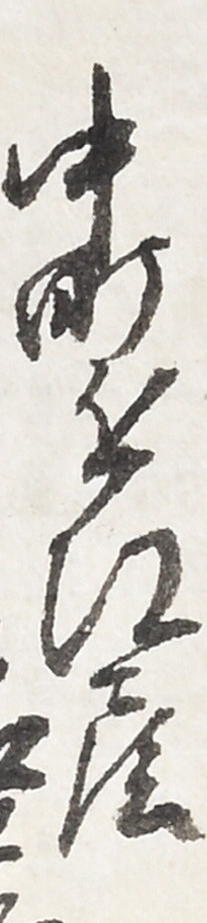中町近江屋
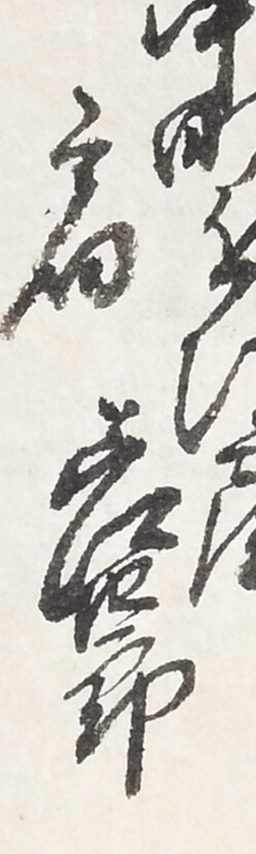宿善四郎
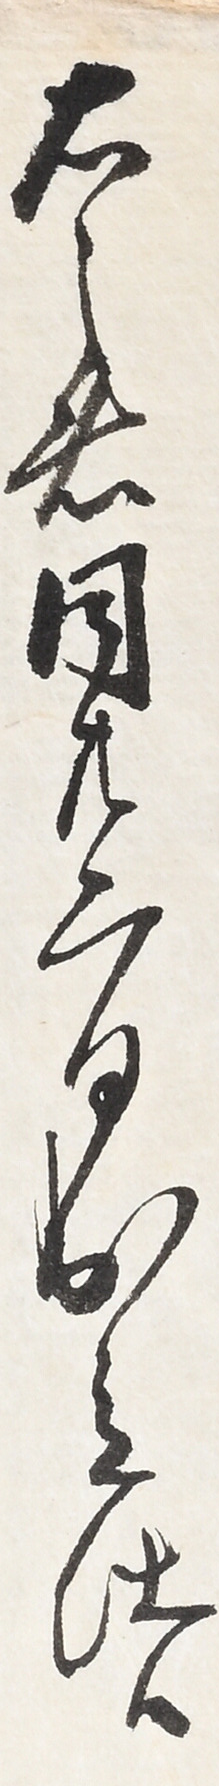右之者同廿二日出立仕候
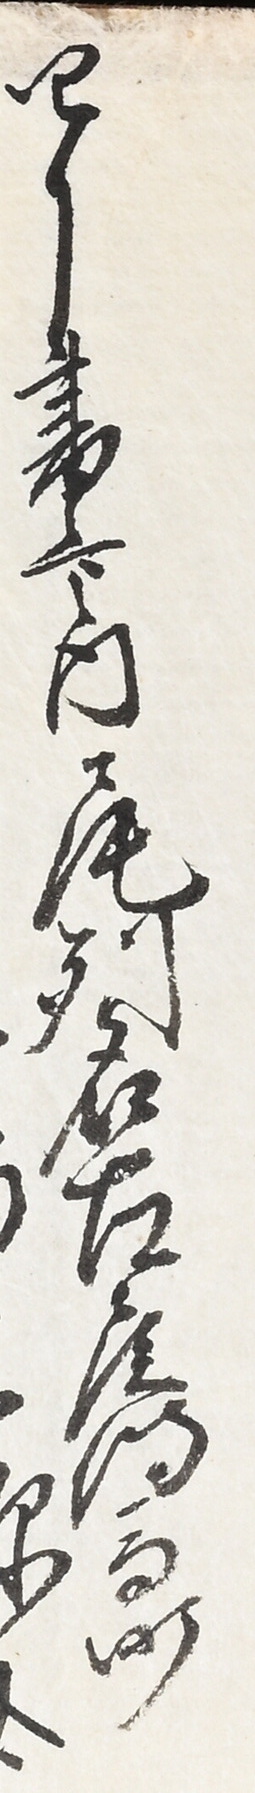四月書上之内尾州名古屋伝馬町
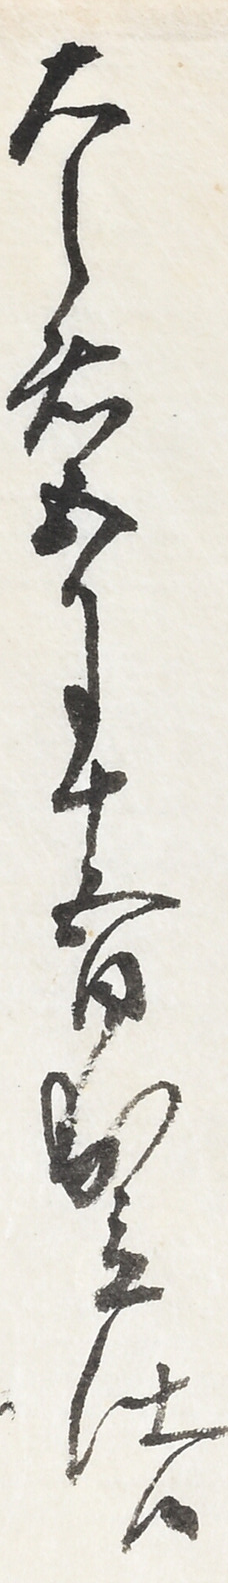右之者五月十五日出立仕候
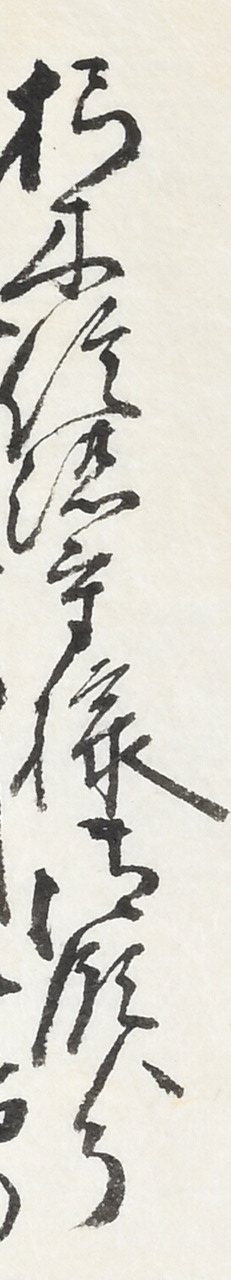朽木信濃守様御領分
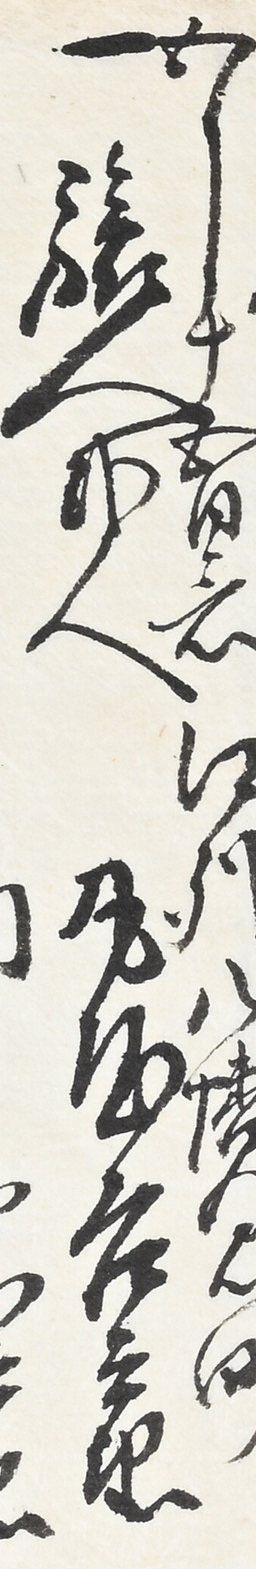一旅人弐人丸屋吉兵衛
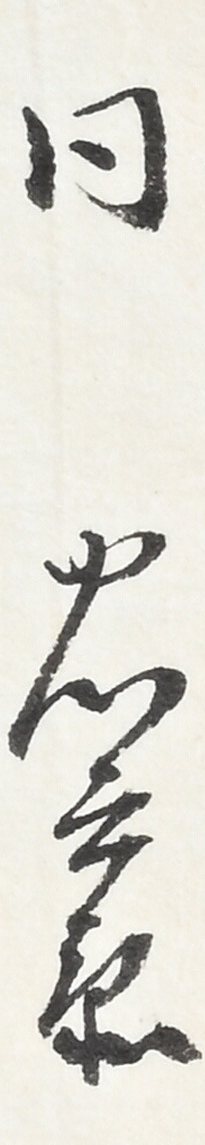同忠兵衛
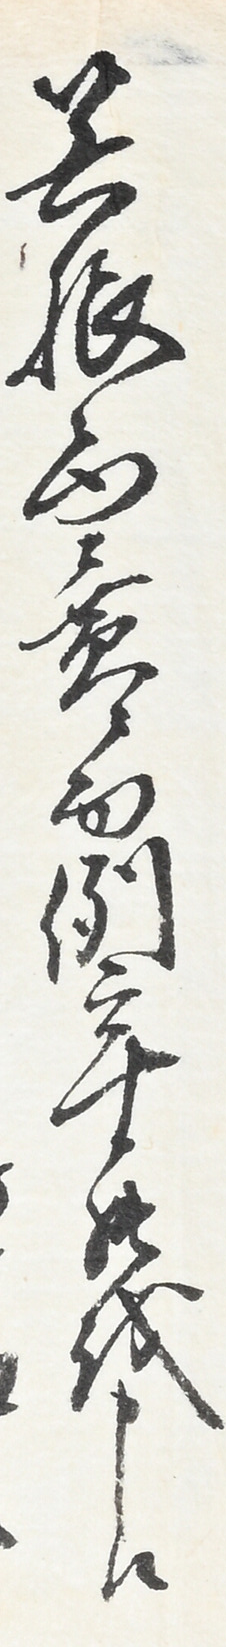呉服商売ニ而例年罷越申候
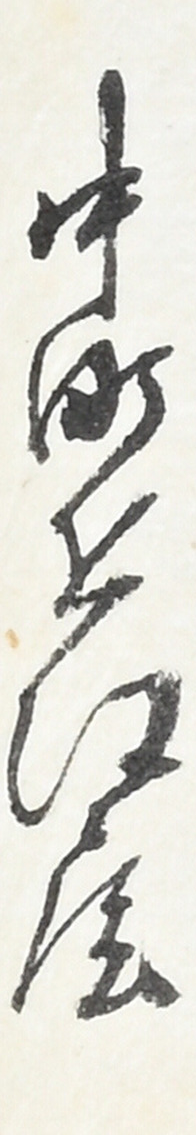中町近江屋
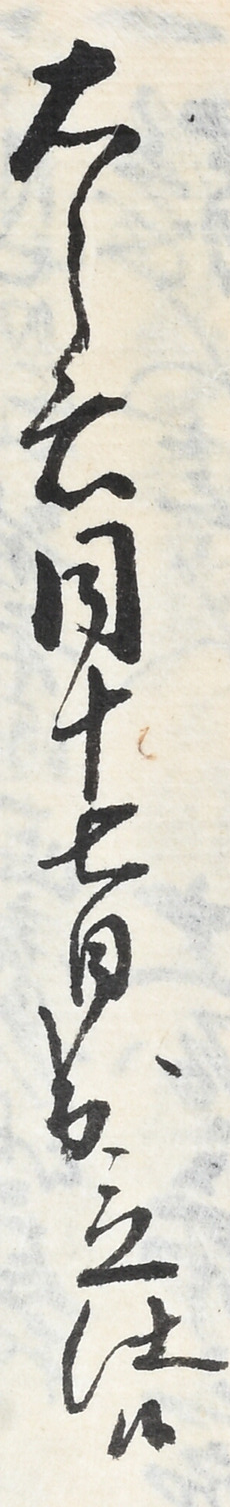右之者同十四日出立仕候
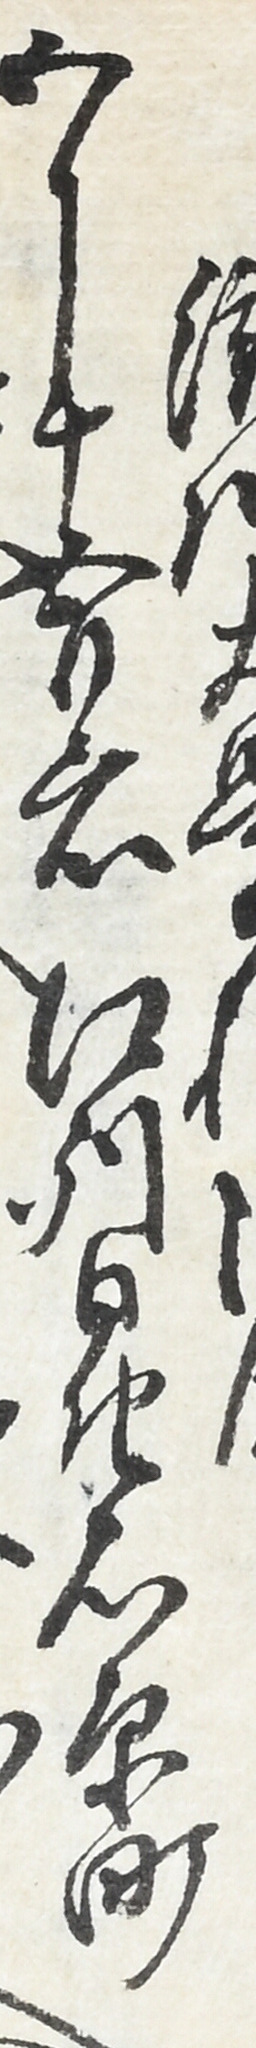五月十五日着江州八幡為心町

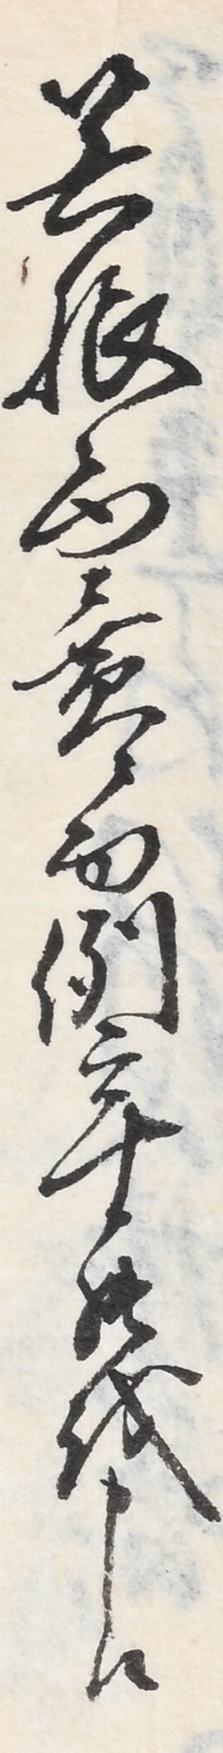唐津商売ニ而例年罷越申候
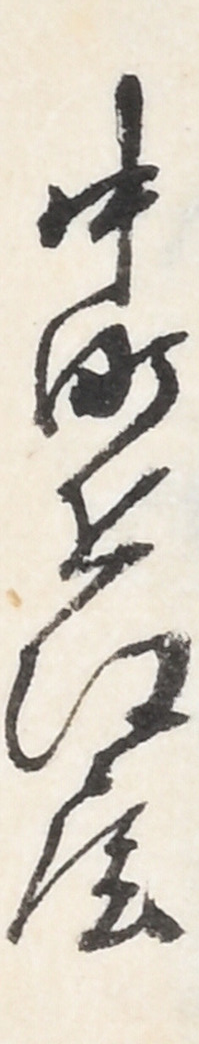中町近江屋
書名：旅人泊控帳
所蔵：伊那市立高遠町図書館・合同会社AMANE
